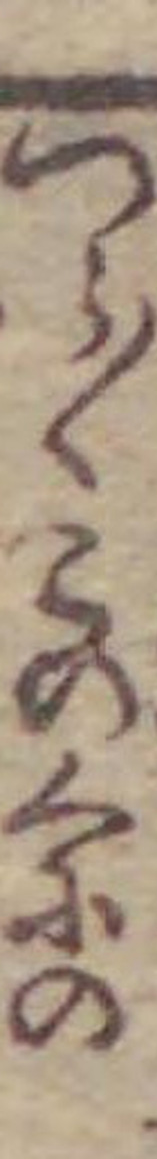つら〳〵このくにの
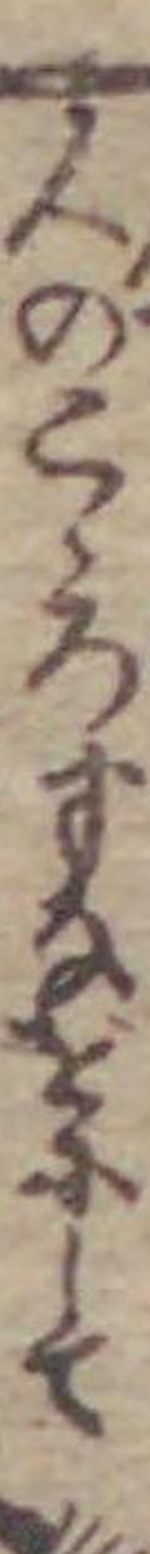人のこゝろすなをにして
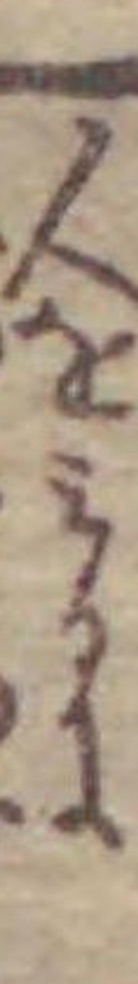人をみるに
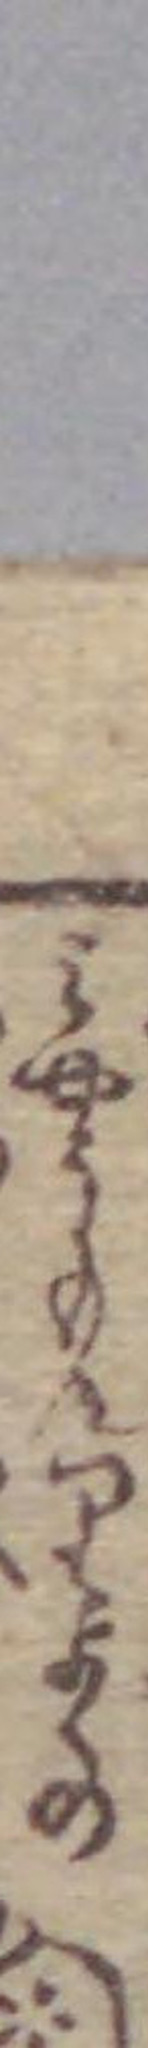みやうもんりよくの
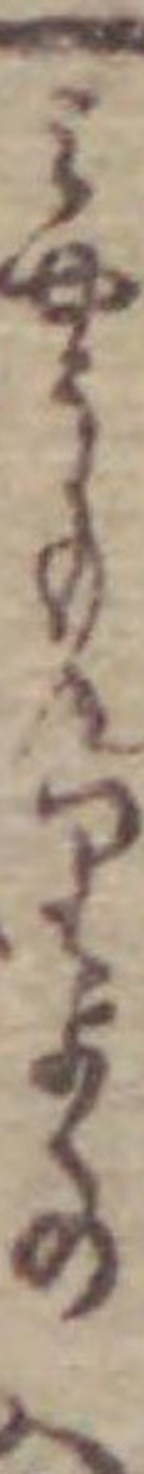みやうもんりよくの
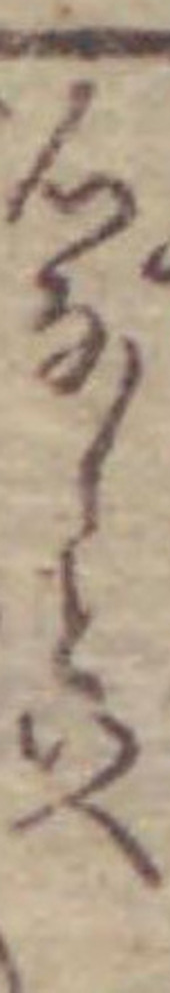心なしといへ
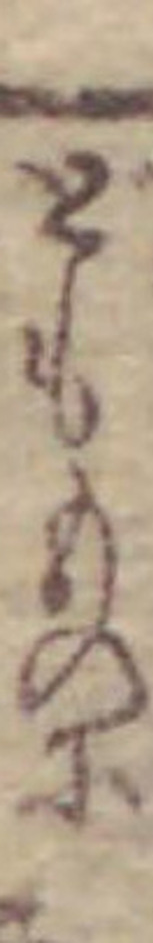どもものに
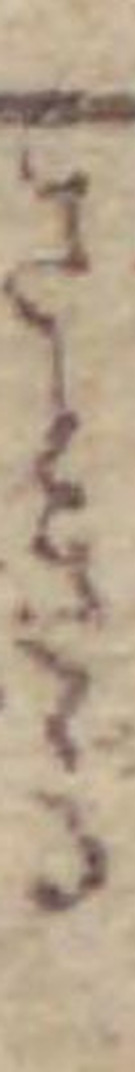さとさゞる
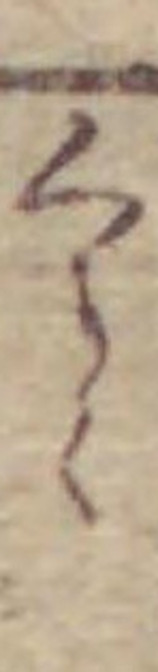くらく
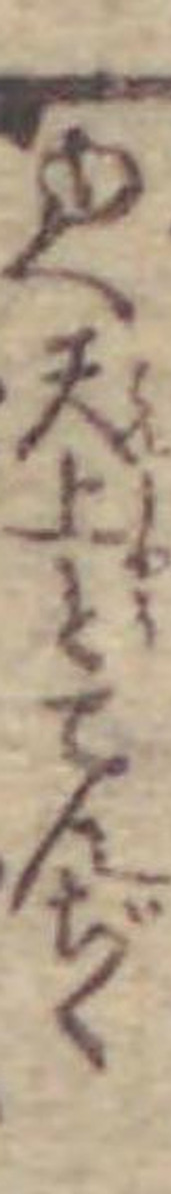ゆへ天上とてんぢく
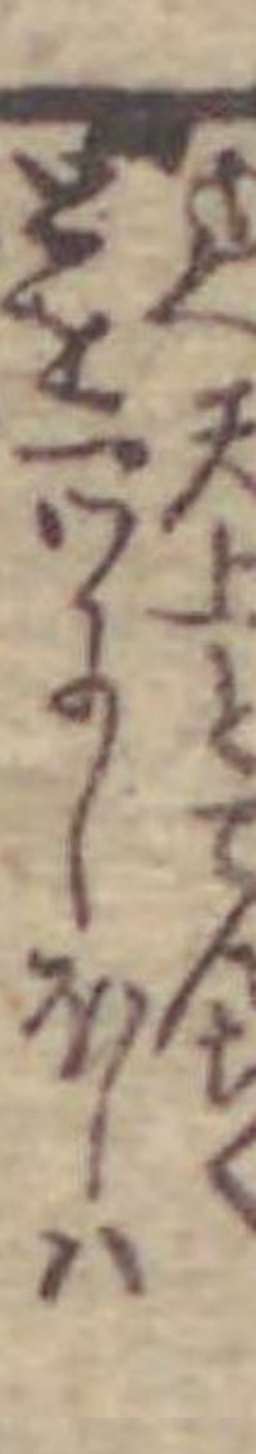とを一つにしほしは
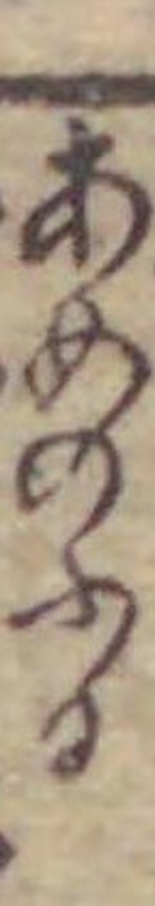あめのふる
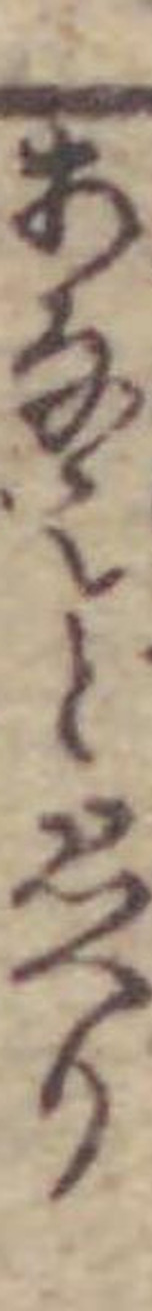あな也と思へり
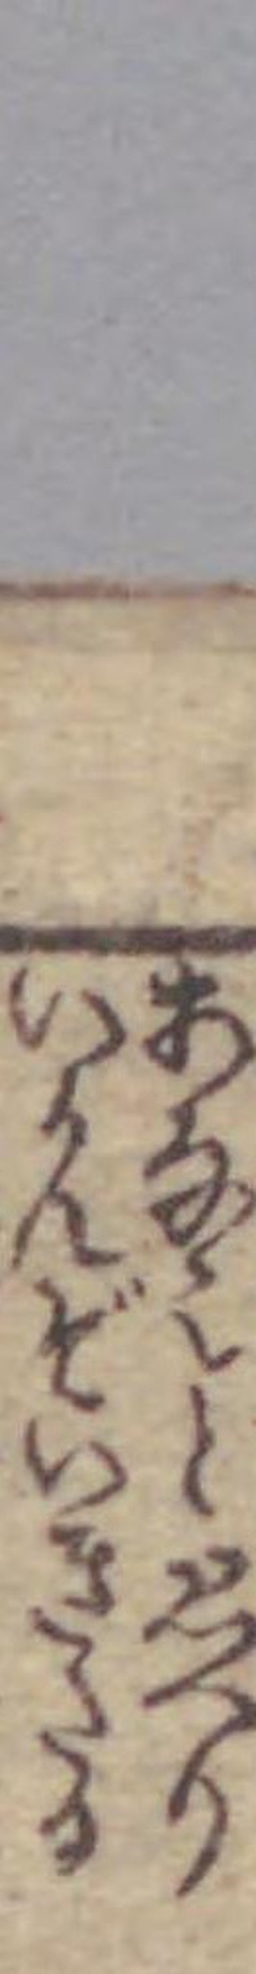いかんぞいきたる
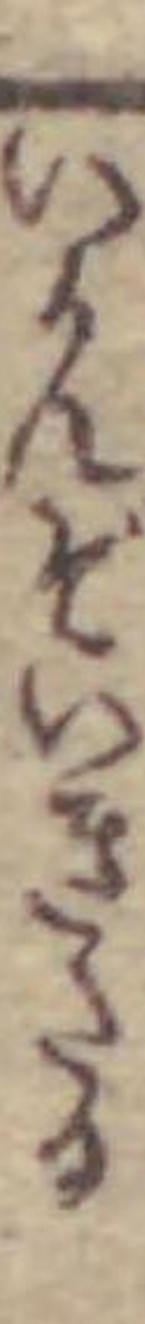いかんぞいきたる
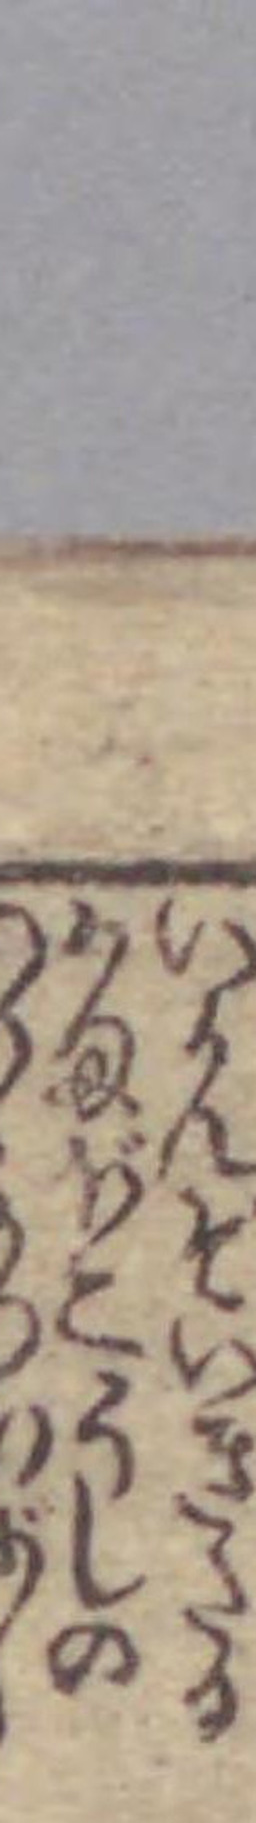かまぼこうしの
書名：和荘兵衛後日話 : 3巻
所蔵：国立国会図書館 National Diet Library, JAPAN
